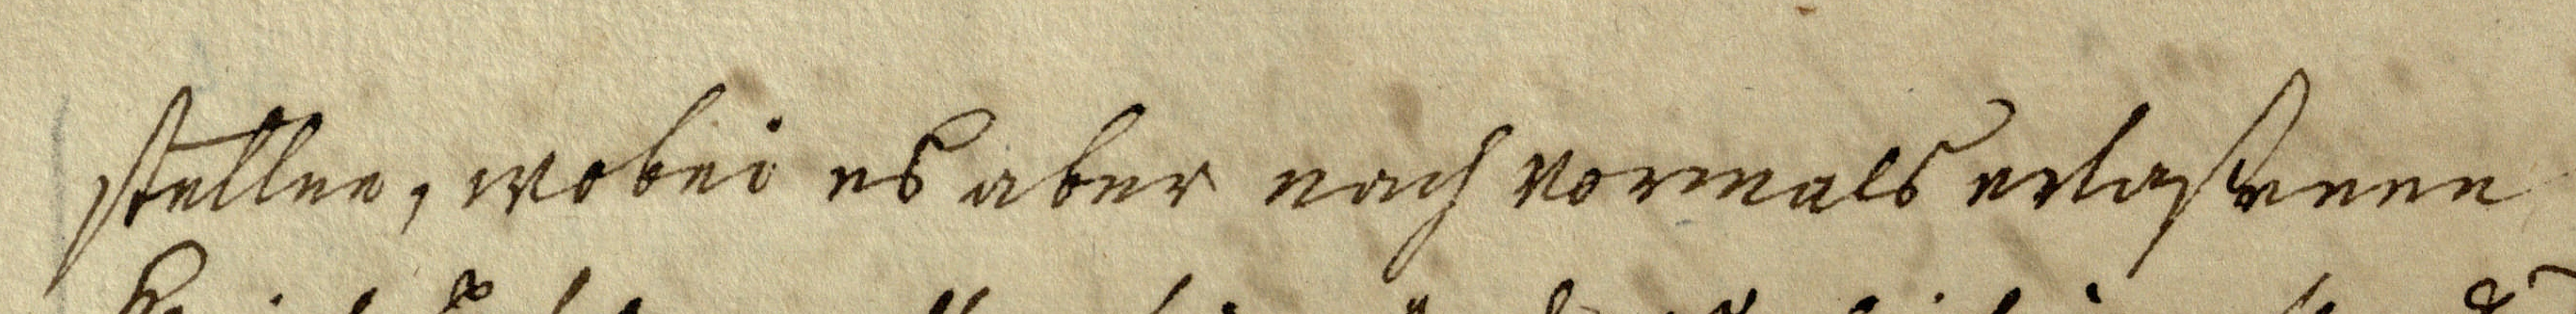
stellen, wobei es aber nach vormals erlaßenen
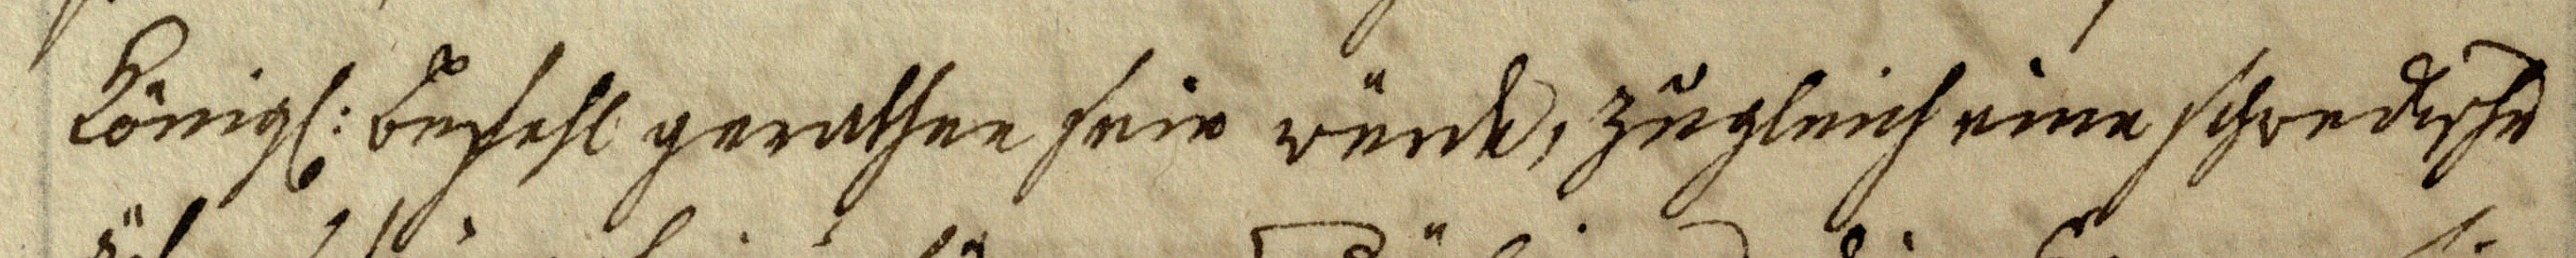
Königl. Befehl gerathen sein würde, zugleich eine schwedische
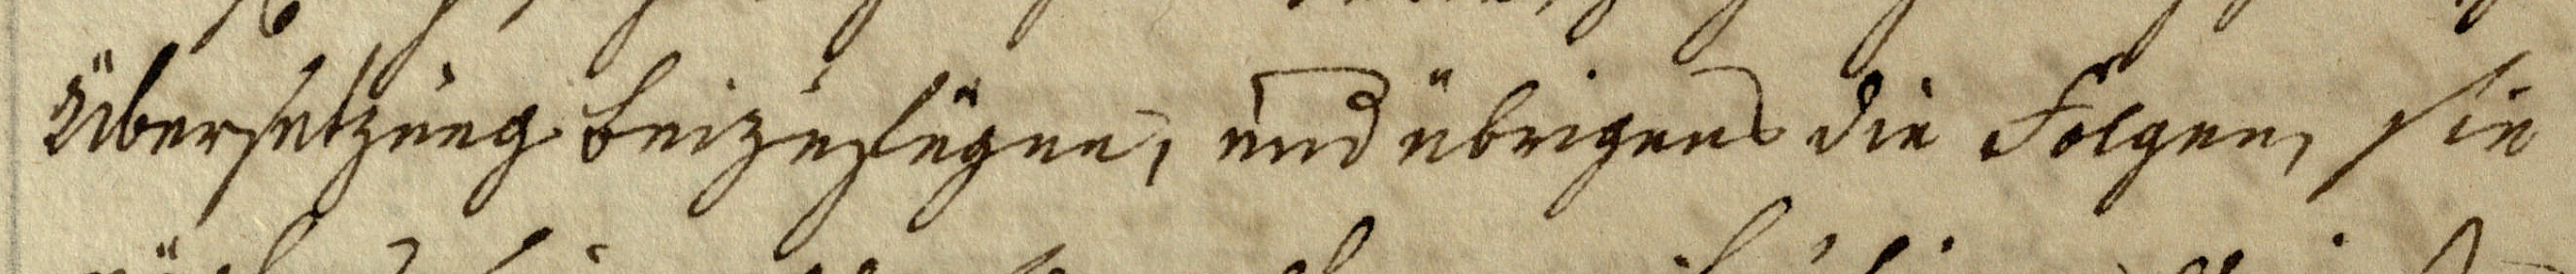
Übersetzung beizufügen, und übrigens die Folgen, sie
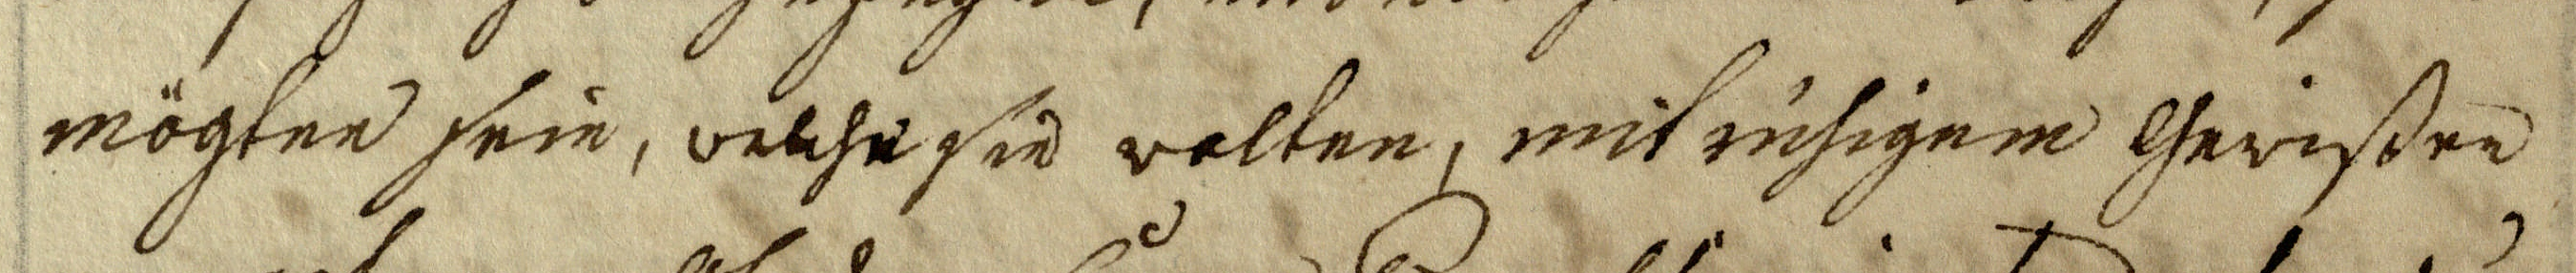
mögten sein, welche sie wolten, mit ruhigem Gewißen
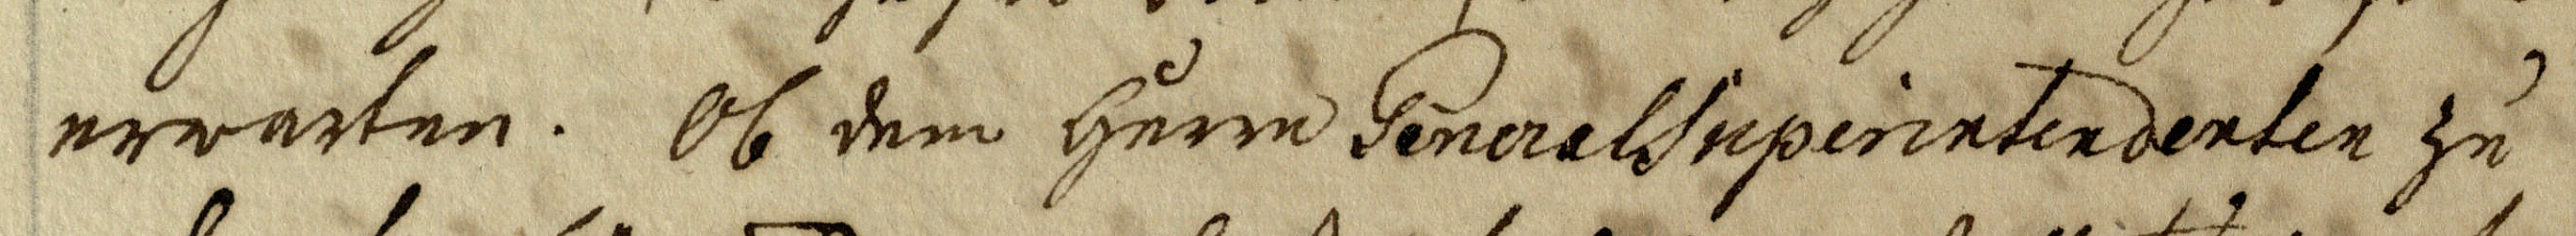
erwarten. Ob dem Herrn GeneralSuperintendenten zu
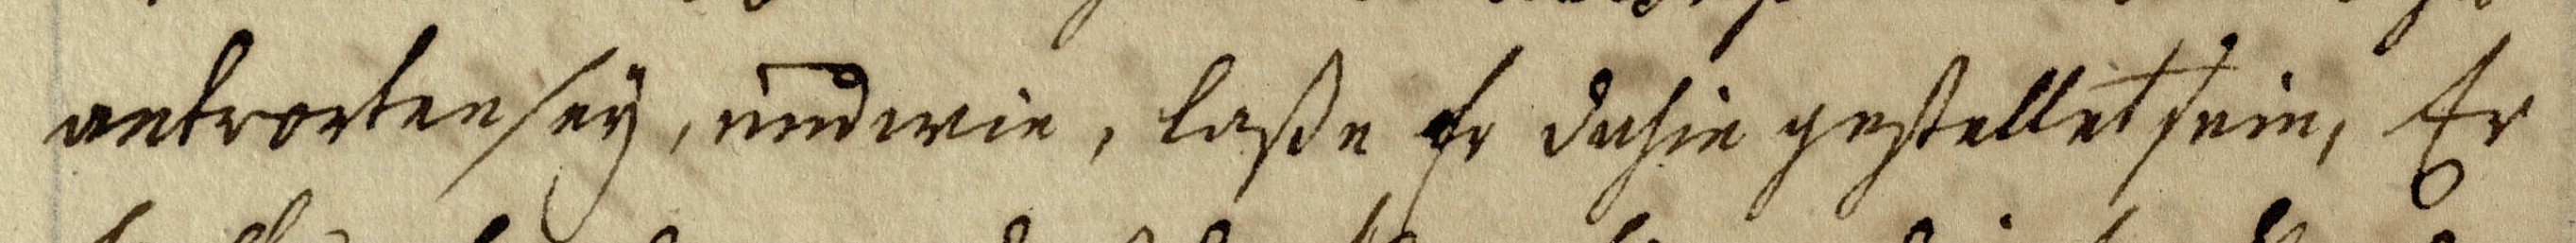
antworten seÿ, und wie, laße Er dahin gestellet sein, Er
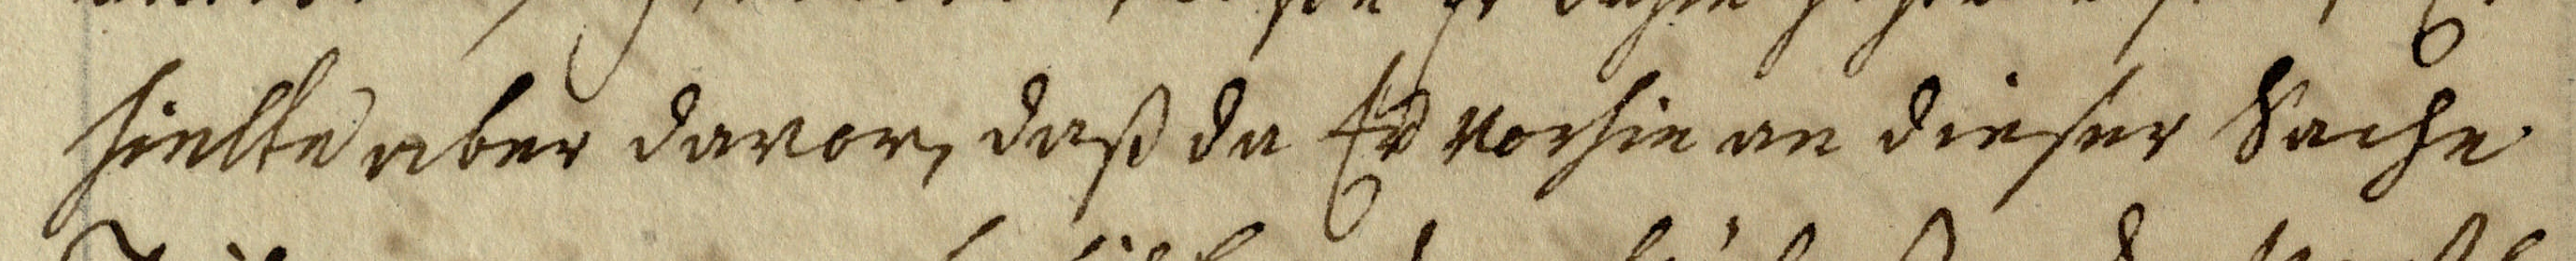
hielte aber davor, daß da Er vorhin an dieser Sache
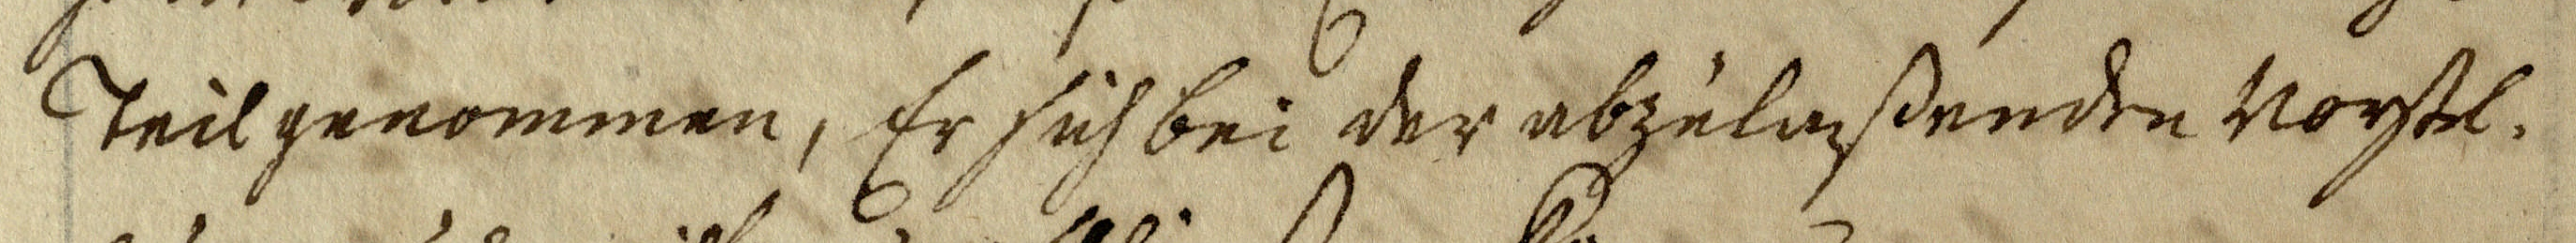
Teil genommen, Er sich bei der abzulassenden Vorstel¬
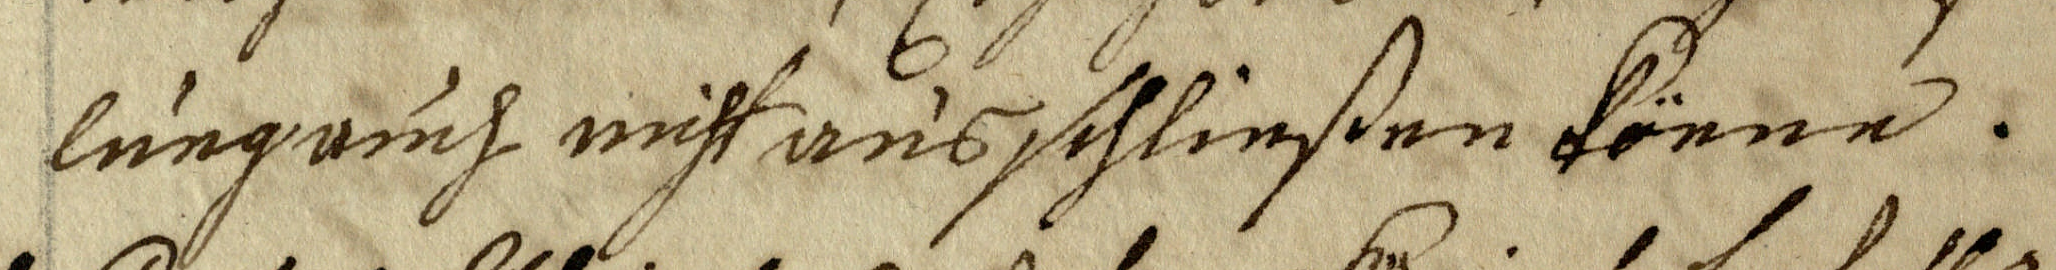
lung auch nicht ausschließen könne.
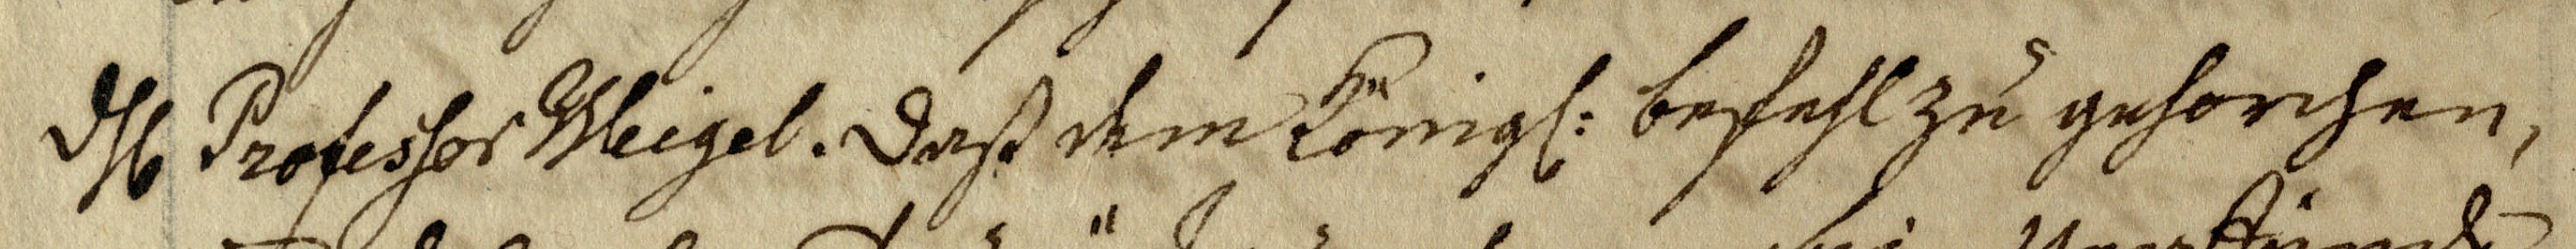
dh Professor Weigel. Daß dem Königl. Befehl zu gehorchen,
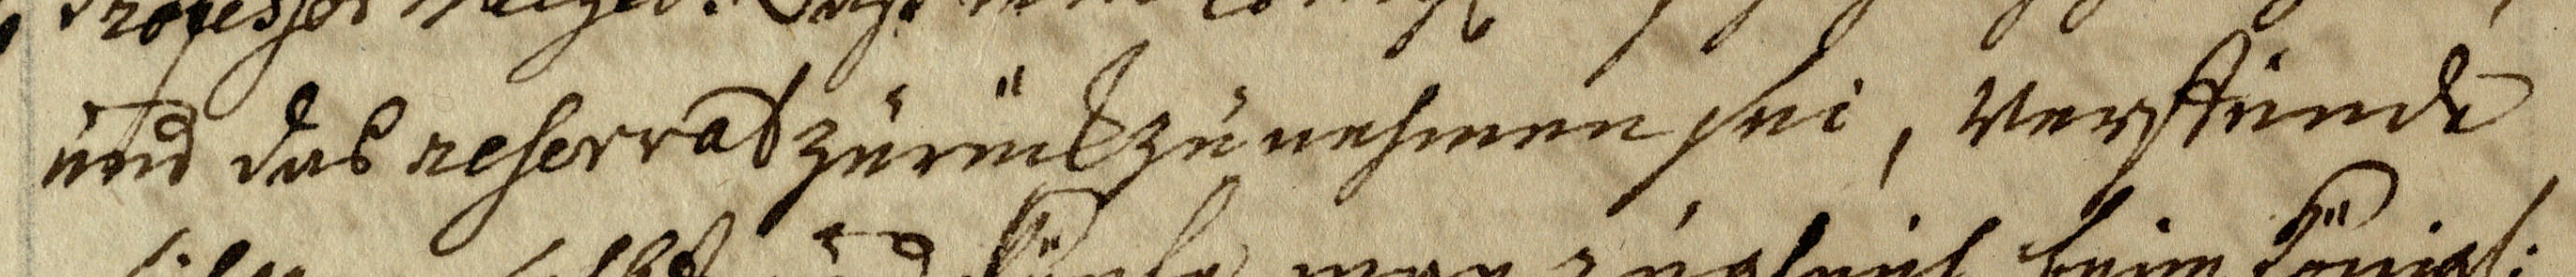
und das reservat zurückzunehmen sei, verstünde
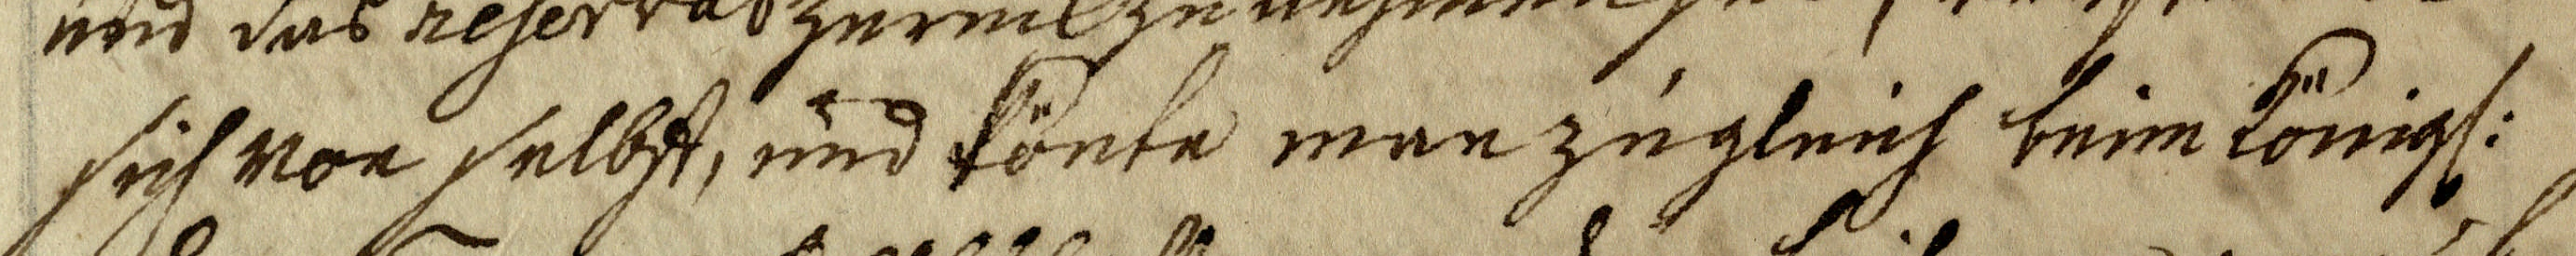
sich von selbst, und könte man zugleich beim Königl.
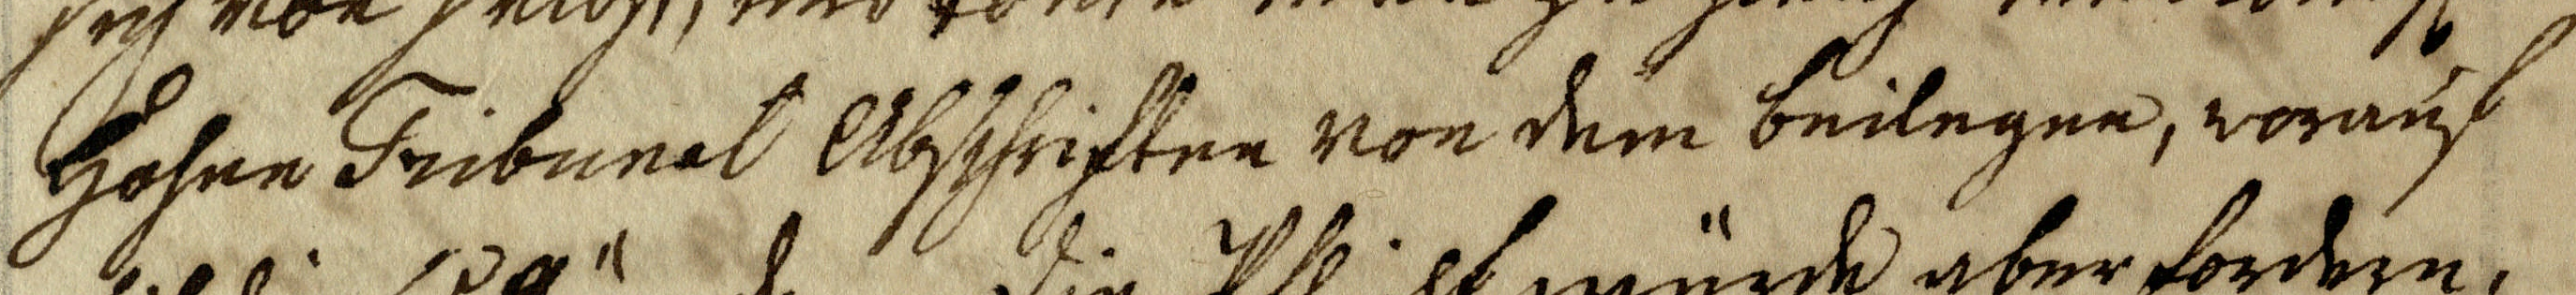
Hohen Tribunal Abschriften von dem beilegen, worauf
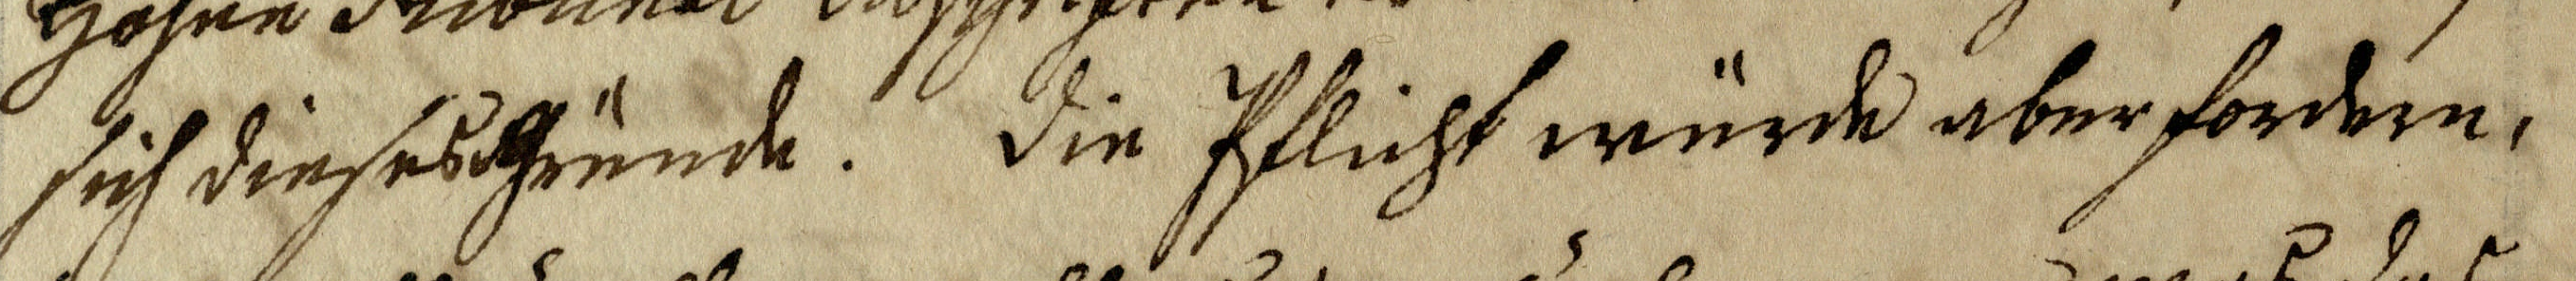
sich dieses gründe. Die Pflicht würde aber fordern,
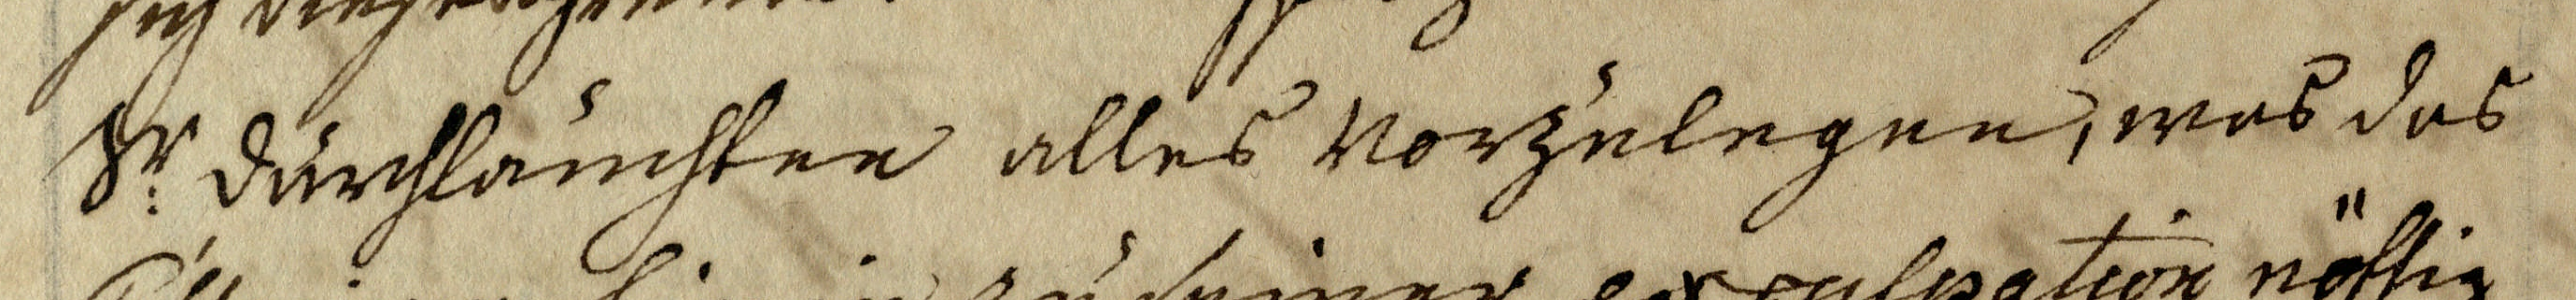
Sr Durchlauchten alles vorzulegen, was das
